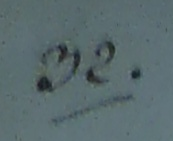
32.
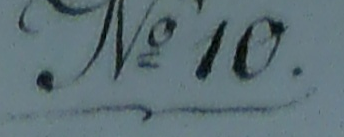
No͇ 10.
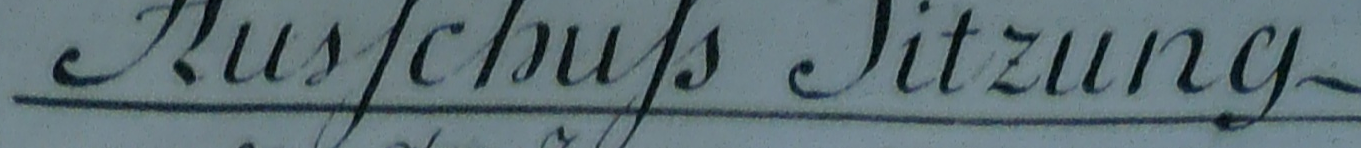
Ausschuss Sitzung
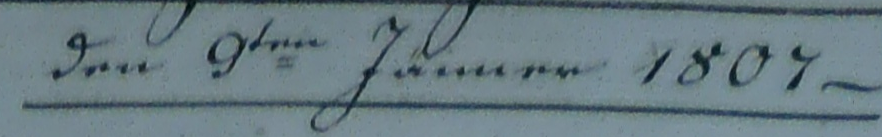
den 9te͇n Jänner 1807
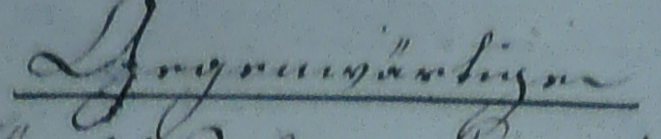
Gegenwärtige
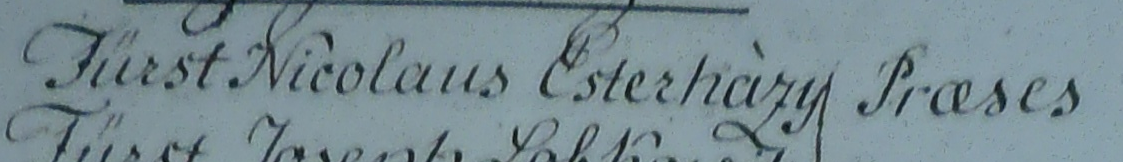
Fürst Nicolaus Esterhàzy Præses
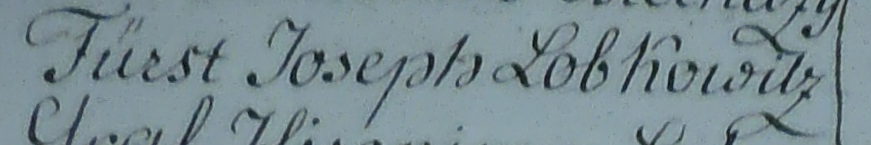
Fürst Joseph Lobkowitz
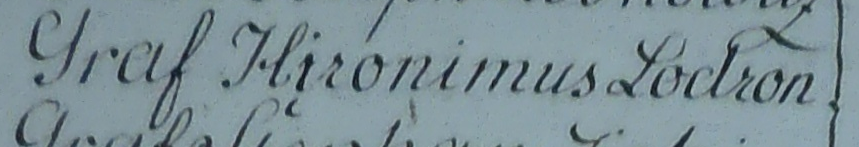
Graf Hironimus Lodron
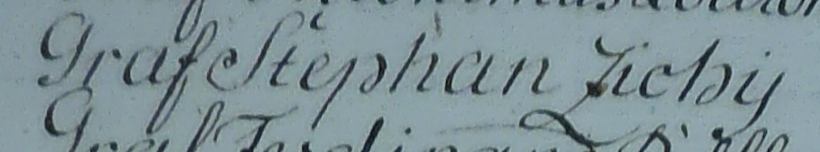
Graf Stephan Zichy
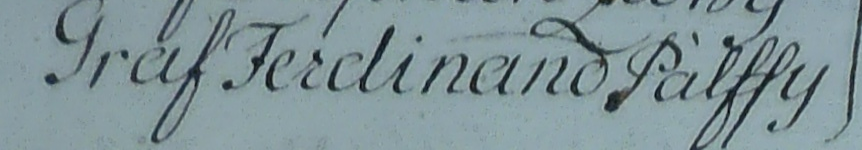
Graf Ferdinand Pàlffy
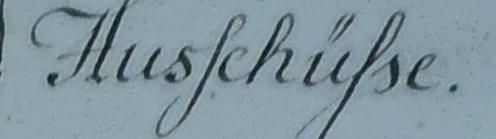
Ausschüsse.
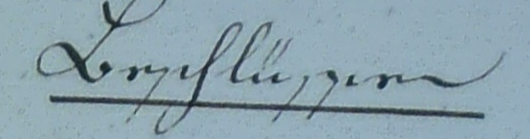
Beschlüsse
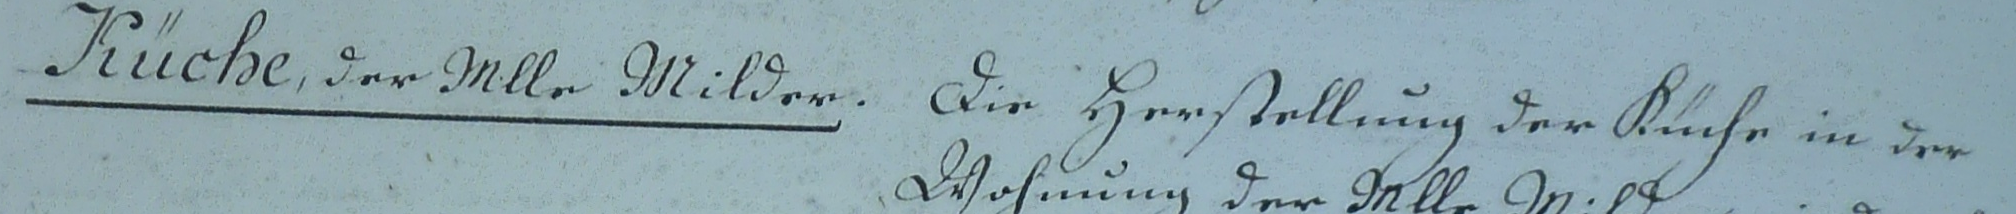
Küche, der Mlle Milder. Die Herstellung der Küche in der
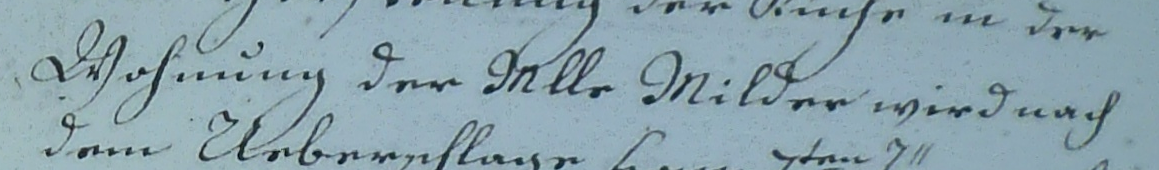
Wohnung der Mlle Milder wird nach
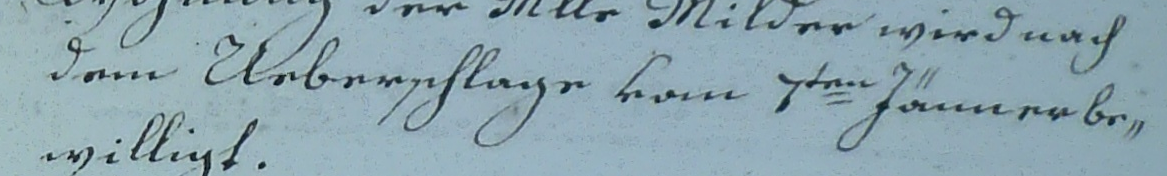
dem Ueberschlage vom 7te͇n Jänner be¬
